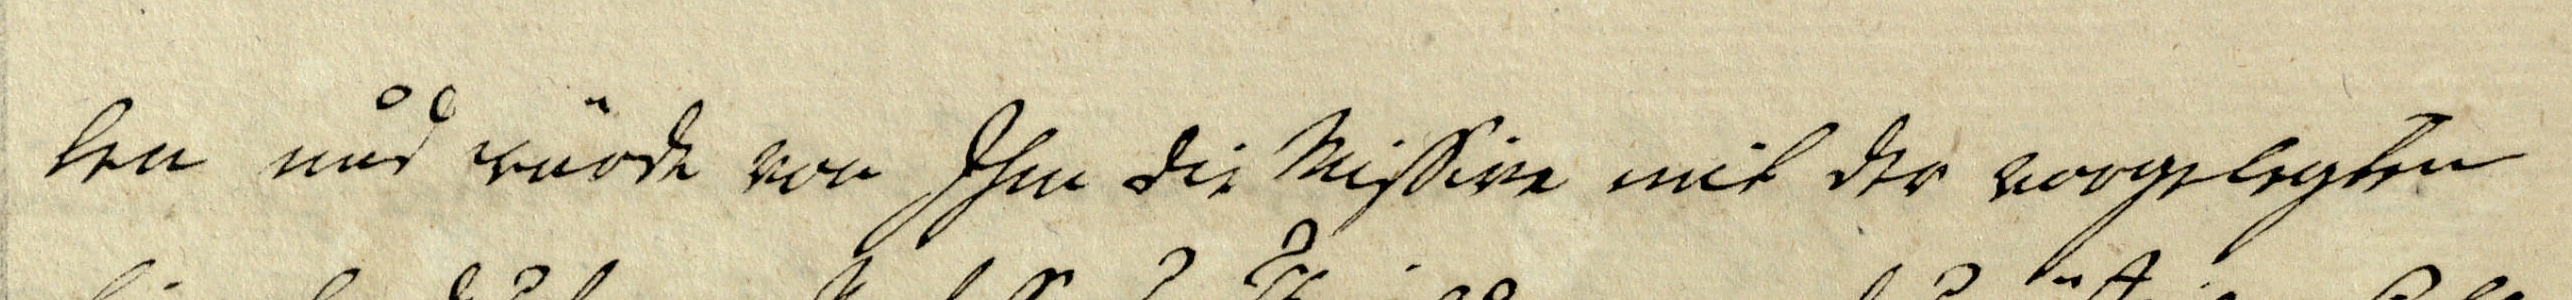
den und würde von Ihm die Missive mit der vorgelegten
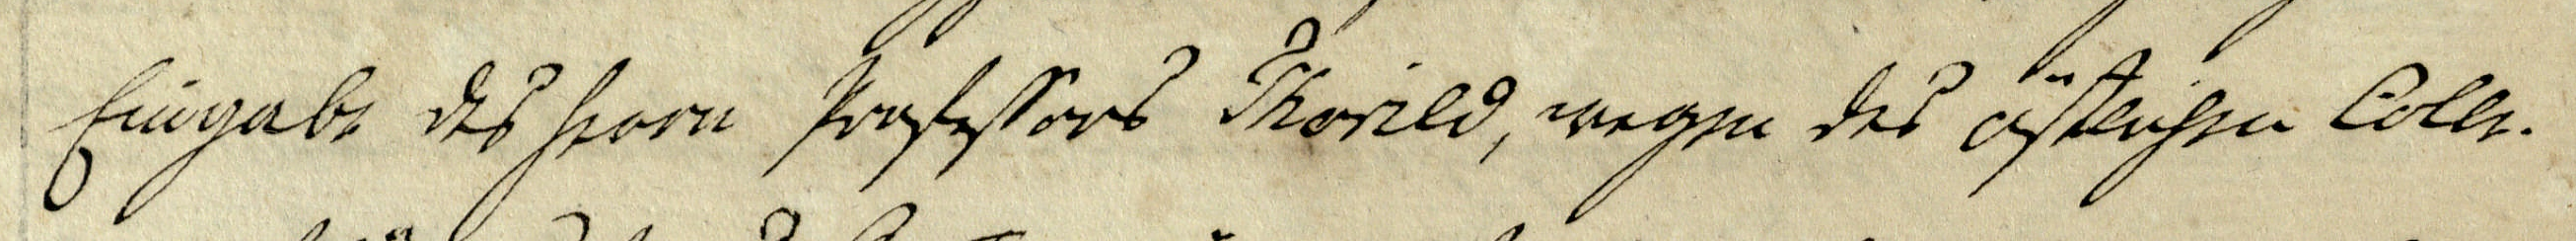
Eingabe des Herrn Professors Thorild, wegen des östlichen Colle¬
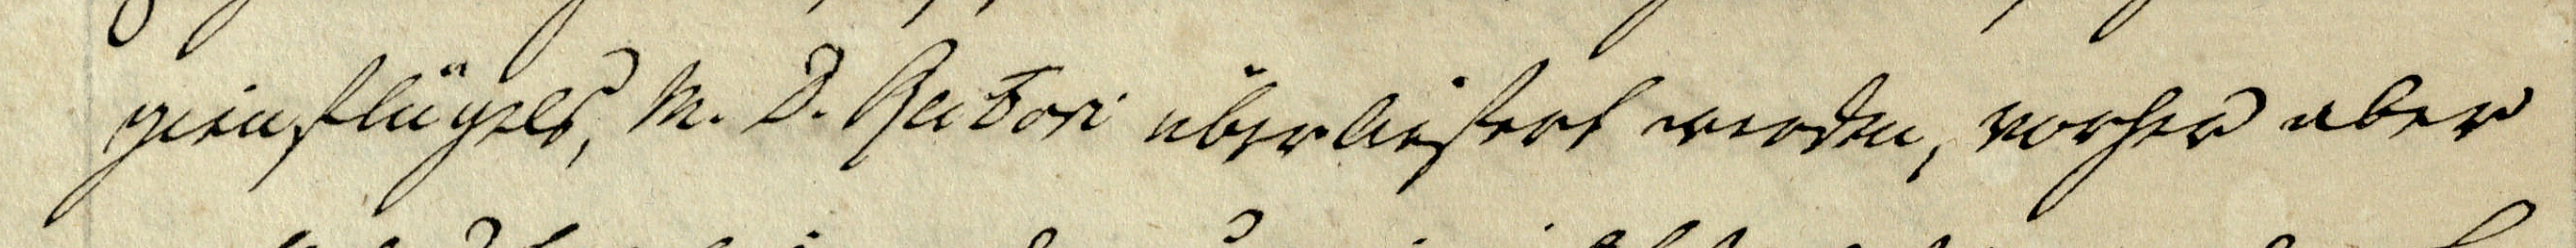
gienflügels, M. D. Rectori überliefert werden, vorher aber
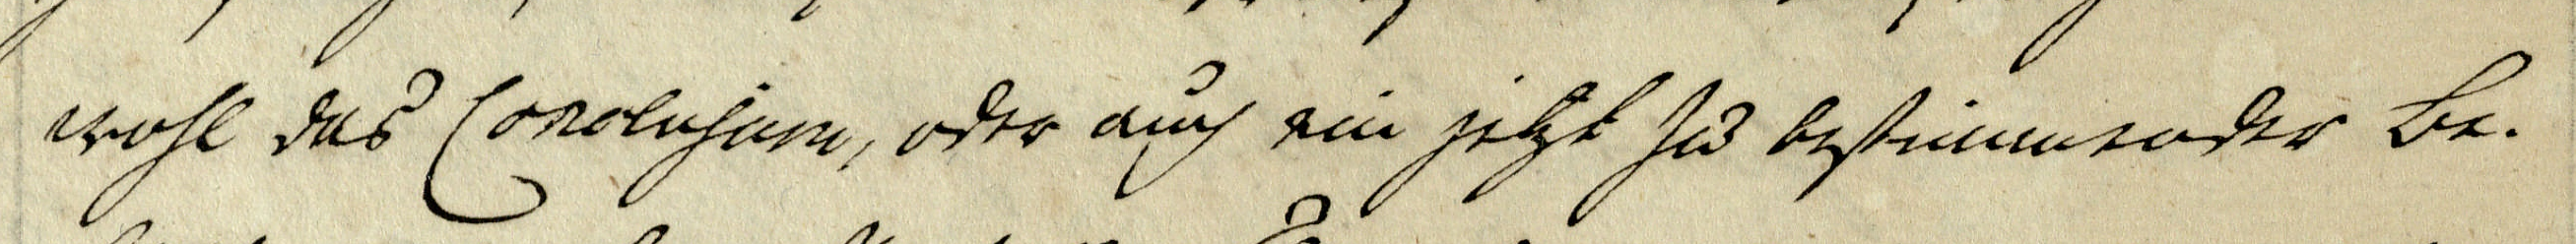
wohl das Conclusum, oder auch ein jetzt zu bestimmender Be¬
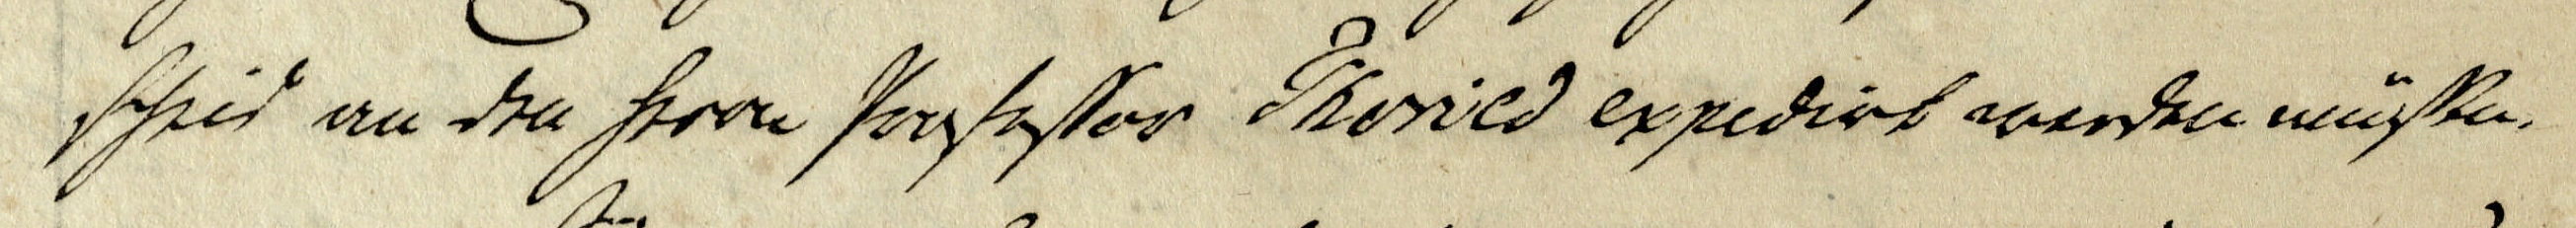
scheid an den Herrn Professor Thorild expedirt werden müssen.
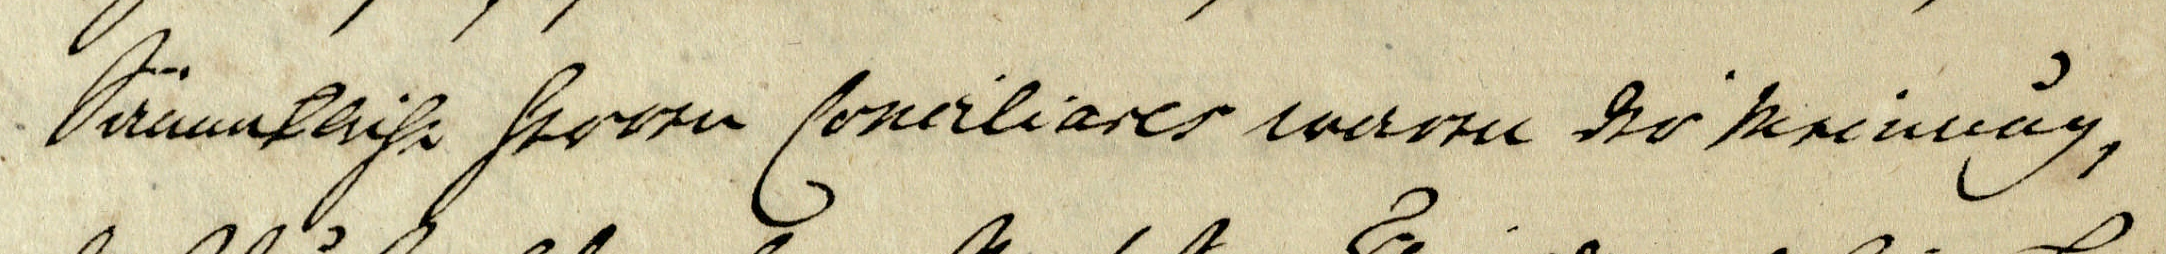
Sämmtliche Herren Conciliares wären der Meinung,
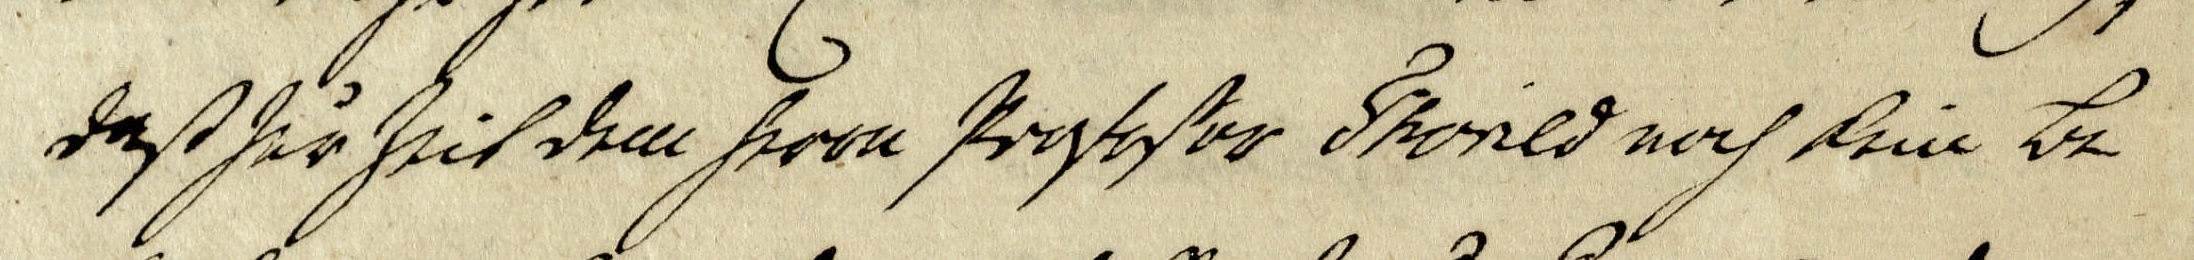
daß zur Zeit dem Herrn Professor Thorild noch kein Be¬
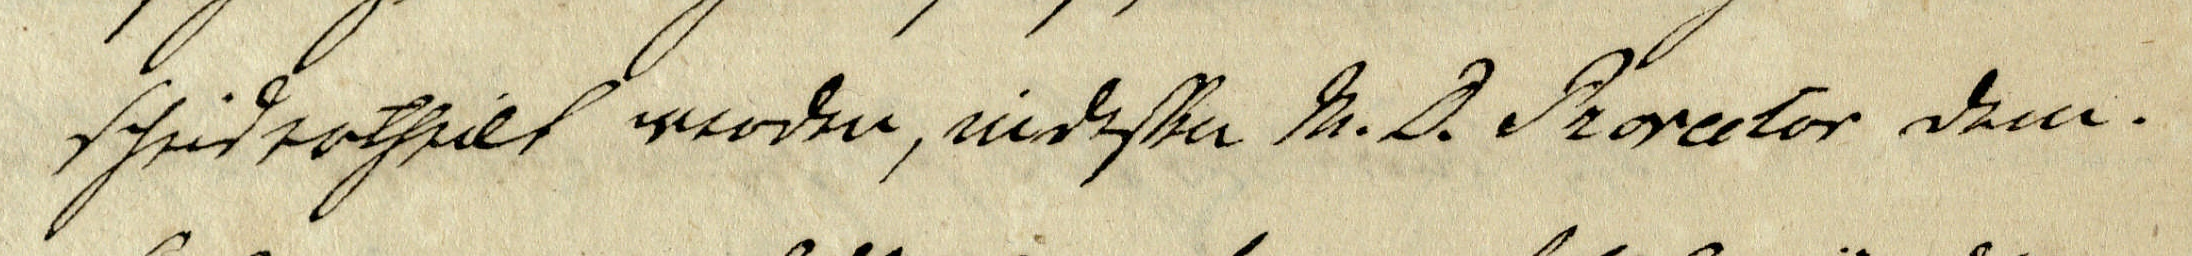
scheid ertheilt werden, indessen M. D. Prorector dem¬
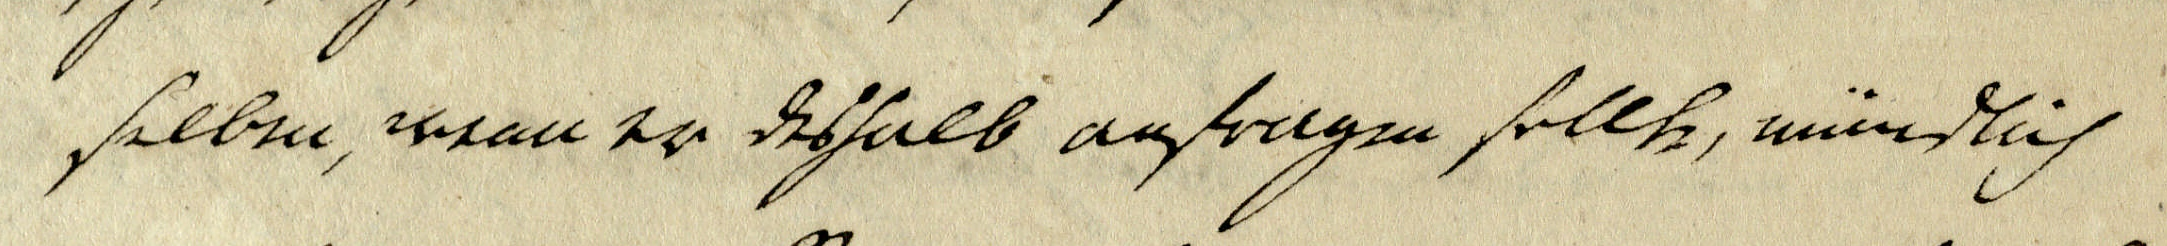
selben, wenn er deshalb anfragen sollte, mündlich
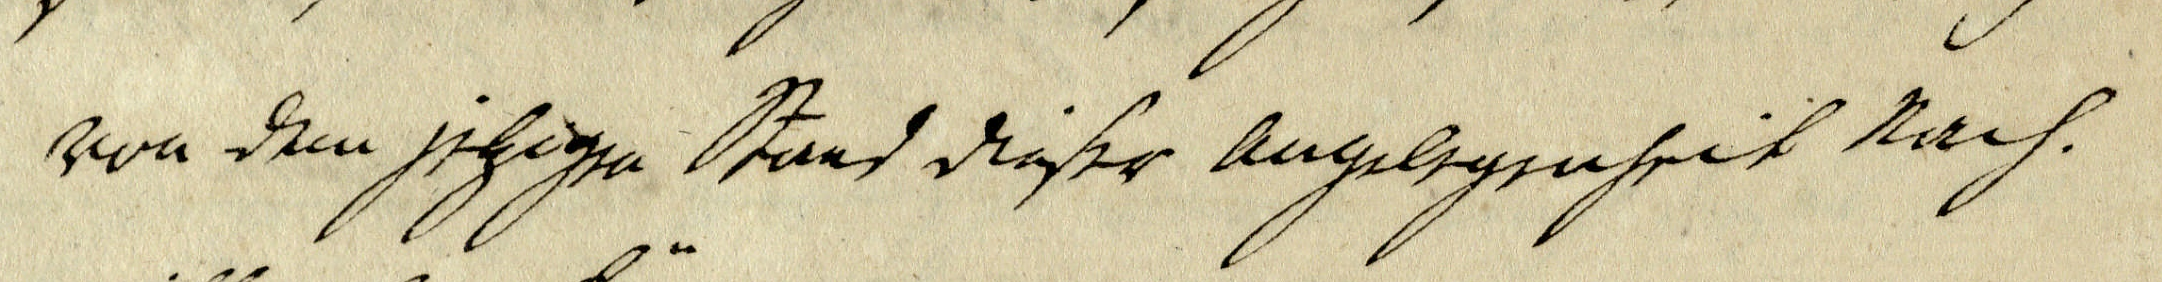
von dem jetzigen Stand dieser Angelegenheit Nach¬
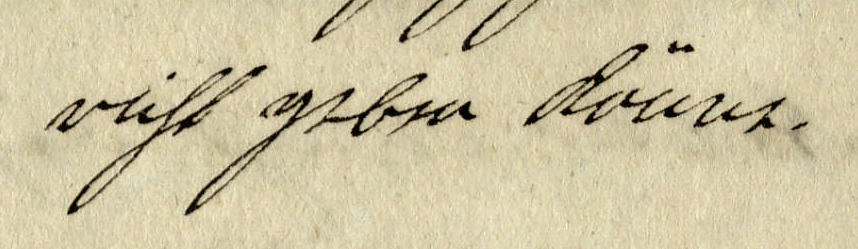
nicht geben könne.
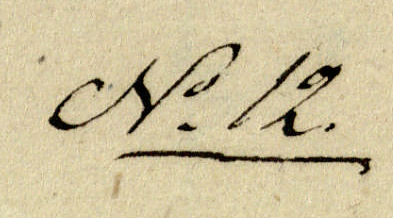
No 12.
